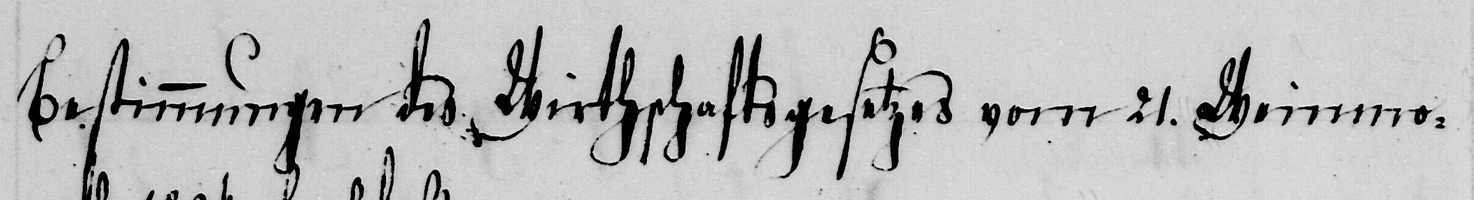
Bestimmungen des Wirthschaftsgesetzes vom 21. Weinmo¬
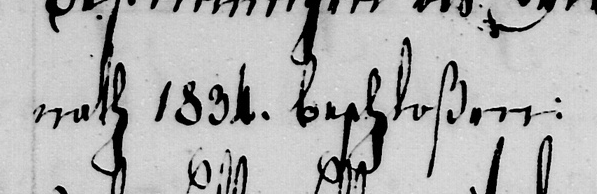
nath 1834. beschloßen:
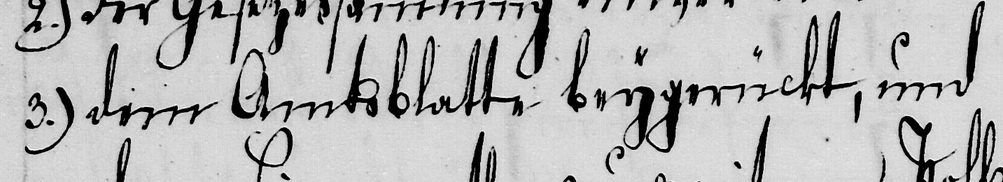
3.) dem Amtsblatte beygerückt, und
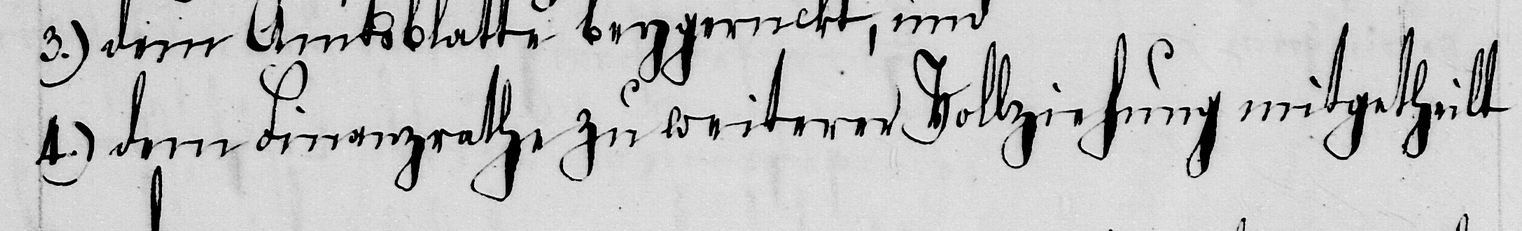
4.) dem Finanzrathe zu weiterer Vollziehung mitgetheilt
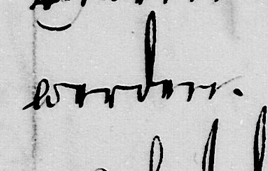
werden.
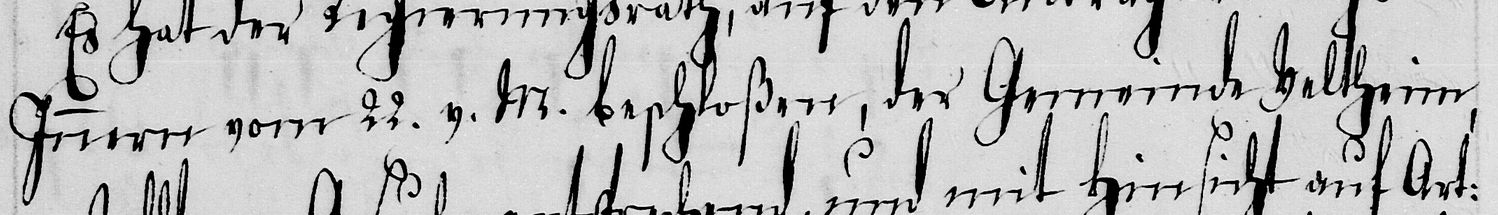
Innern vom 22. v. M. beschloßen, der Gemeinde Veltheim,
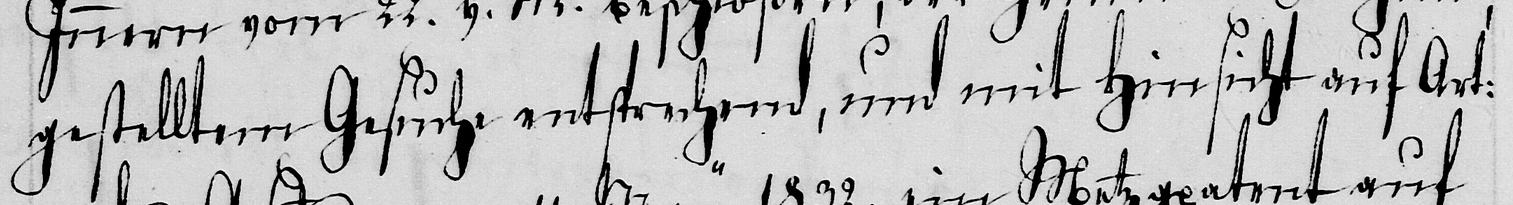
gestelltem Gesuche entsprechend, und mit Hinsicht auf Art:
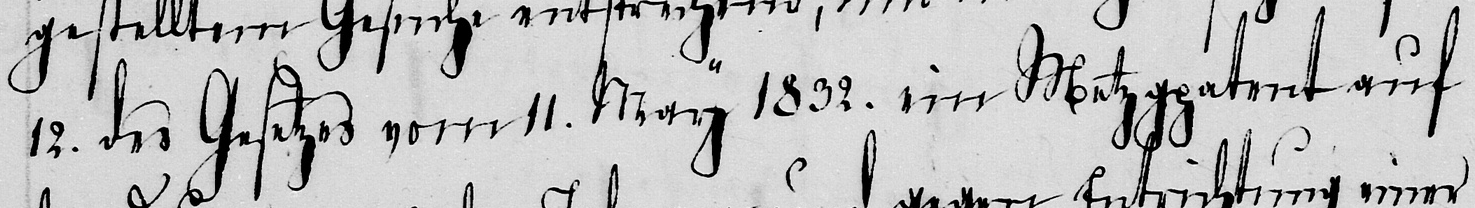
12. des Gesetzes vom 11. May 1832. ein Metzgpatent auf
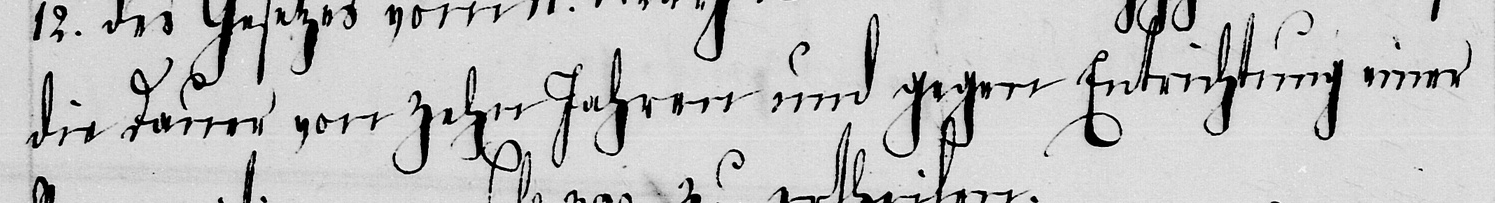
die Dauer von zehn Jahren und gegen Entrichtung einer
